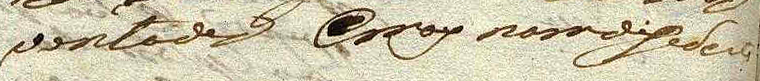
vontades e mais nam disse deste
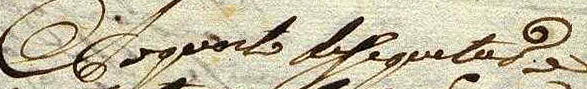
Ao quarto disse que tudo
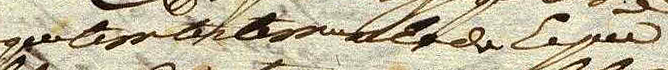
que tem testemunhado he pu
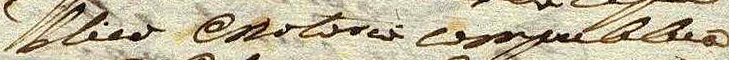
blico e notorio com publica
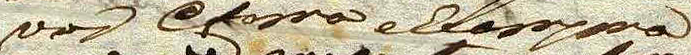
voz e forma e he a mesma
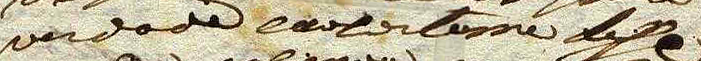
verdade e ao costume disse
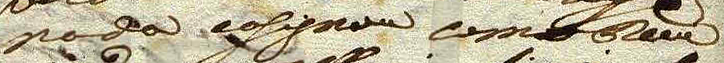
nada e asignou com o Reue
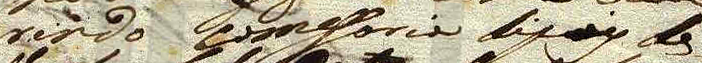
rendo comessario dipois de
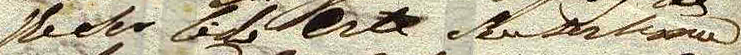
lhe ser lido este seu testemu
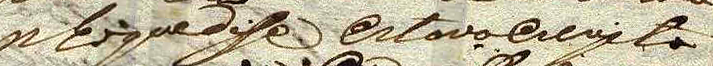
nho que dise estava escripto
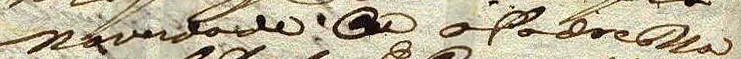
na verdade eu o Padre Ma
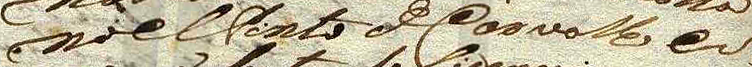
noel Pinto de Carvalho es
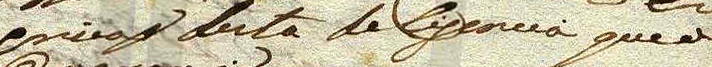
criuaõ desta deligencia que o
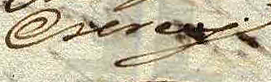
escreuj
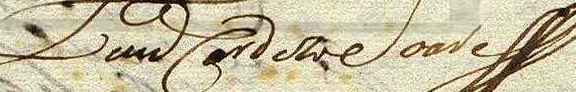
Luiz Cardozo Soares
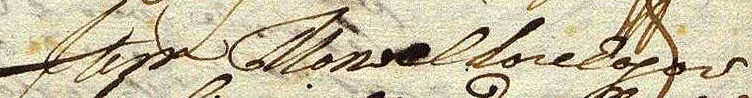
Jtem Manoel das Chagas
